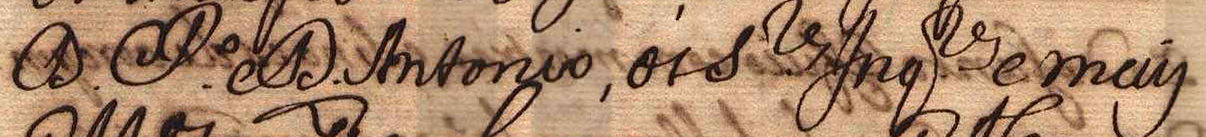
D. P.o e D.Antonio, os s.res Jnq.res e mais
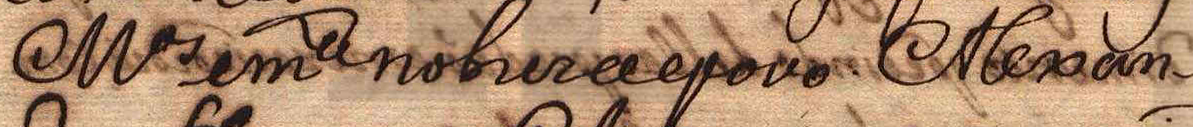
Mos e mta nobreza e povo Alexan
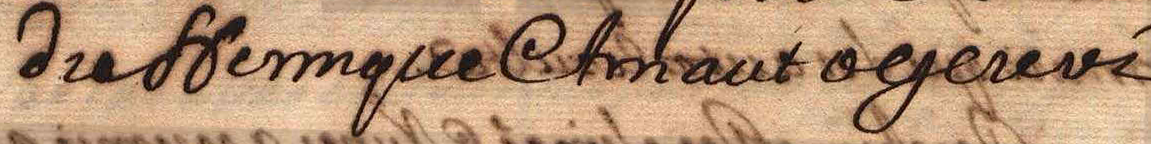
dre Henrique Arnaut o escrevi
